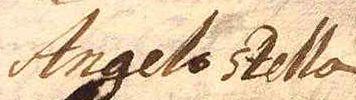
Angelo stella
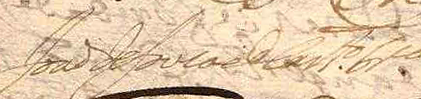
Joaõ de souza de Cast.o br.co
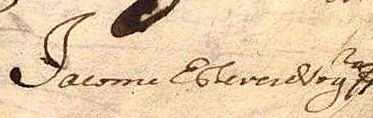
Iacome Esteves Nogra
